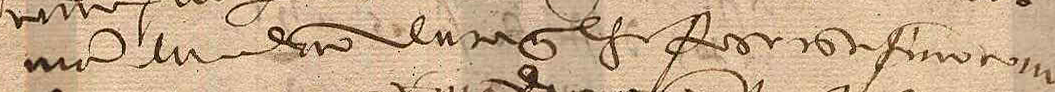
mādou o dito doutor q̄ lhe fose este feito com
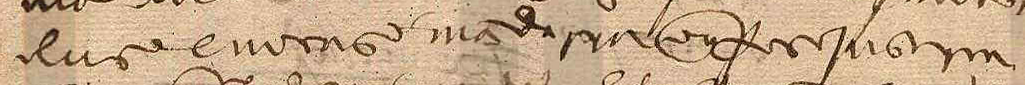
cluso e no caso mādarya o q̄ fose Justyça
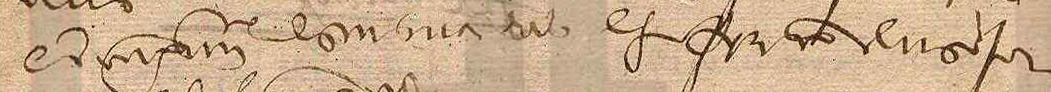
e ē cōp̄imto de seu mādado lhe fyz cōcluso Jor
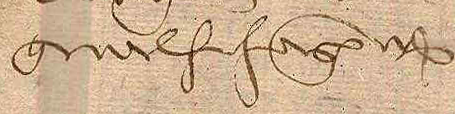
ge coelho ho esp̄uy
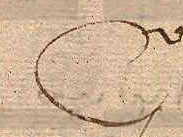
Co
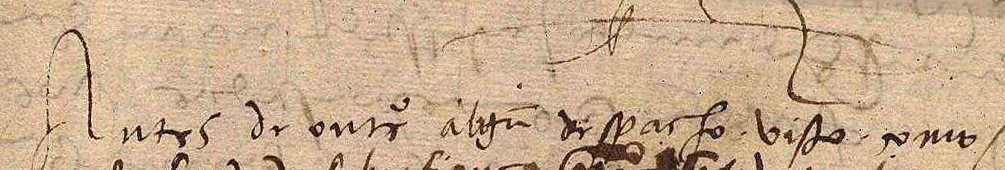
Antes de outro algū despacho visto como
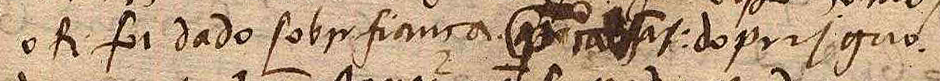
o R. foi dado sobre fiança p̄o causa / do perjguo
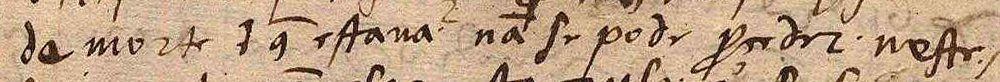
da morte ē q̄ estaua nā se pode ꝓceder neste /
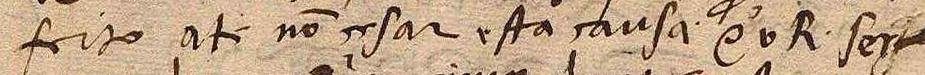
feito ate nō cesar esta causa e o R. ser ja
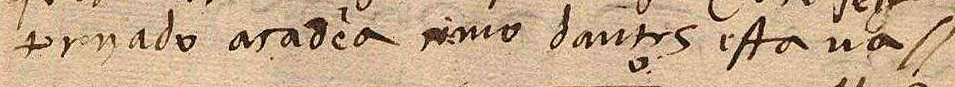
tornado a cadea como dantes estaua //
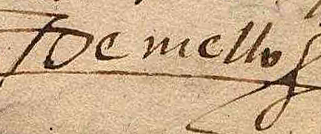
Jo de mello
